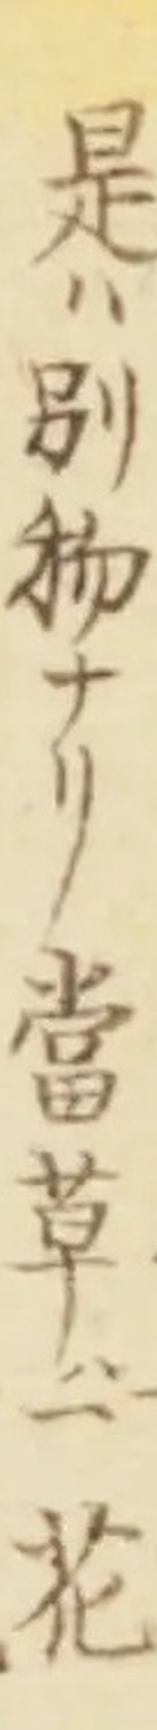是ハ別ナリ当草ハ一花
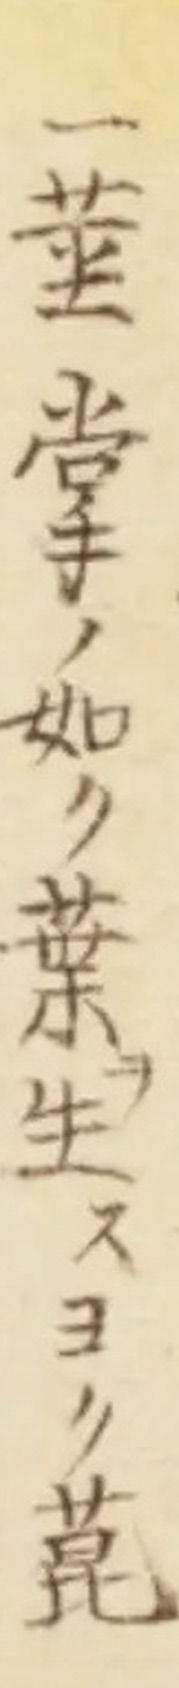一茎掌ノ如ク葉ヲ生スヨク菎
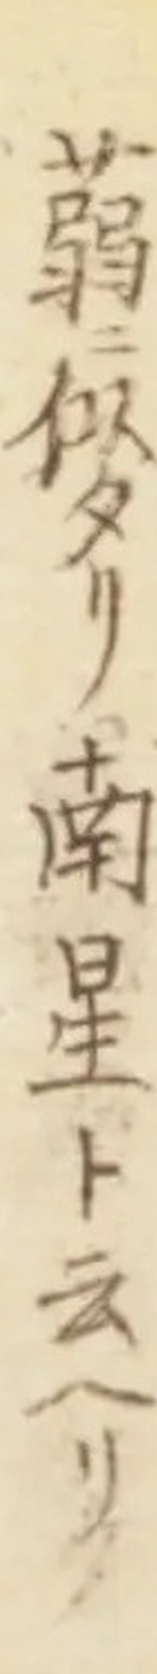蒻ニ似タリ南星ト云ヘリ
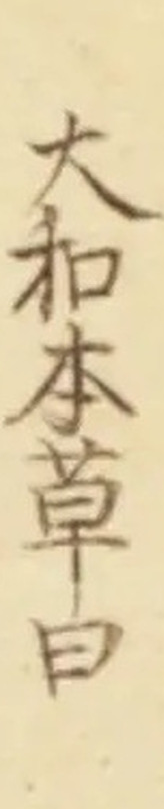大和本草曰
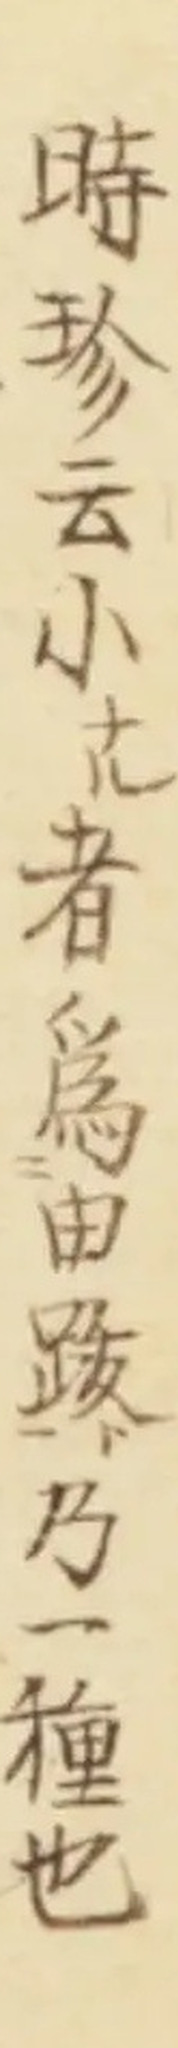時珍云小者為由跋乃一種也
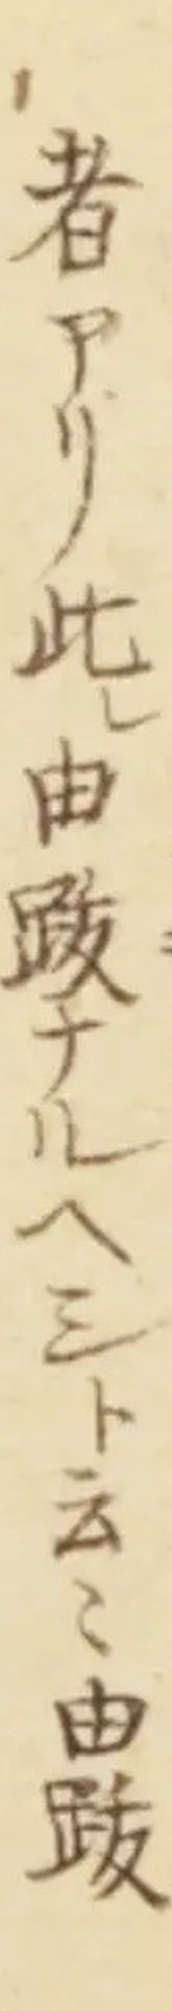者アリ此由跋ナルヘシ云々由跋
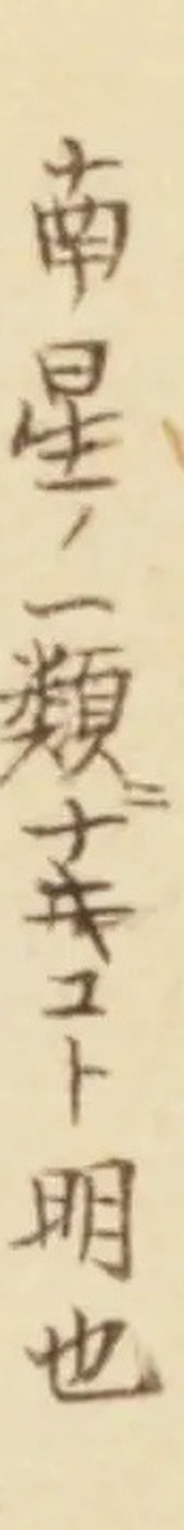南星一類ナキコト明也
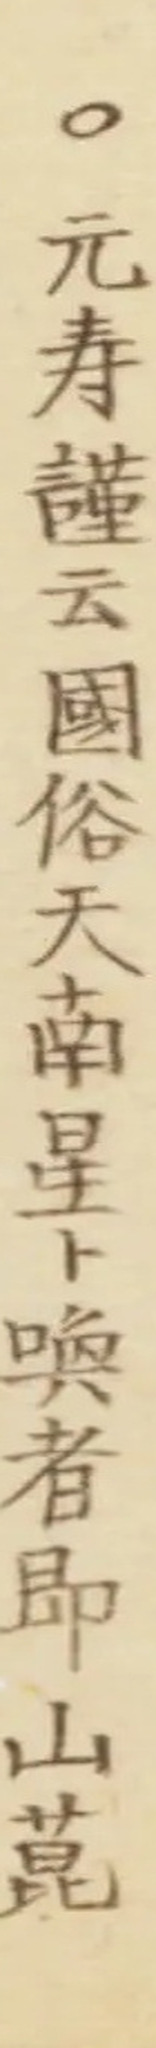◦元寿謹曰国俗天南星ト喚者即山菎
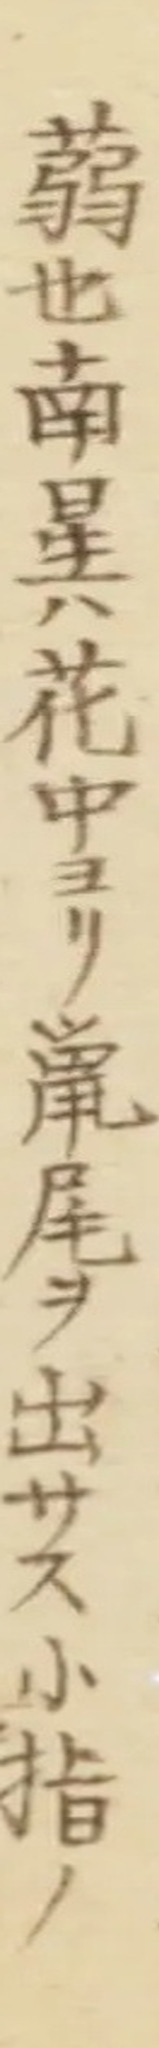蒻也南星ハ花中ヨリ鼠尾ヲ出サズ小指ノ
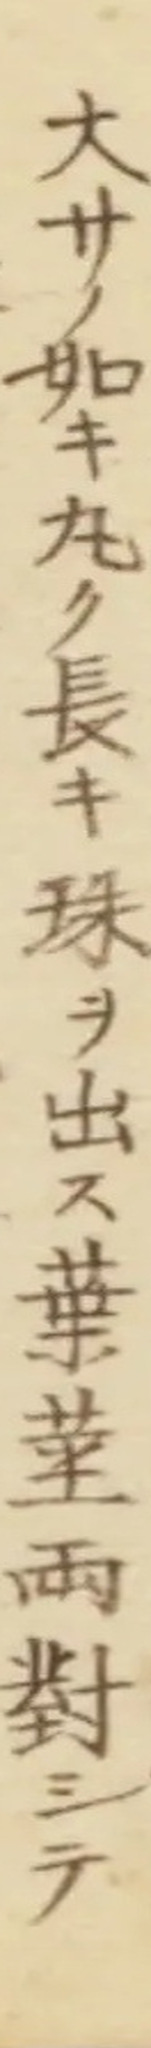大サノ如キ丸ク珠ヲ出ス葉茎両対シテ
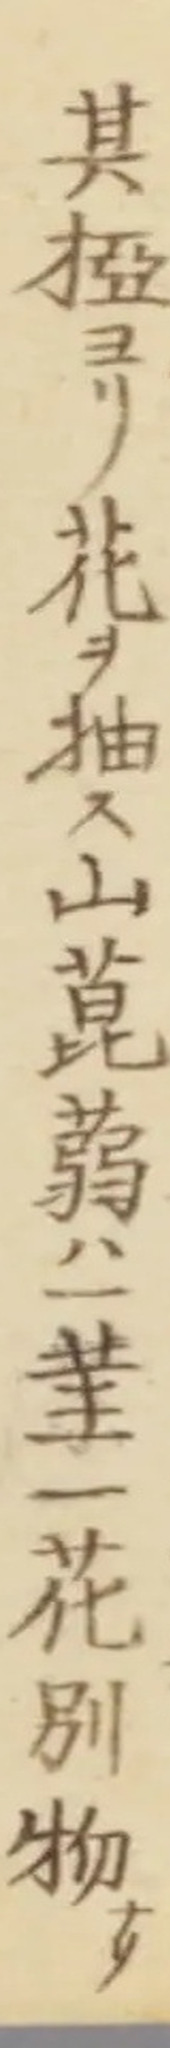其椏ヨリ花ヲ抽ス山菎蒻ハ一茎一花別物
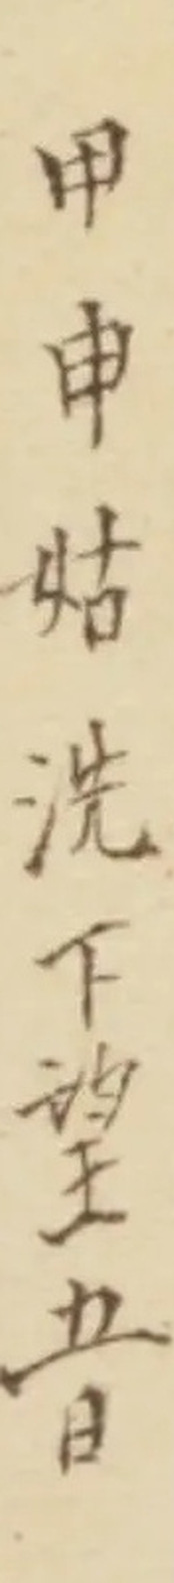甲申姑洗下望五日
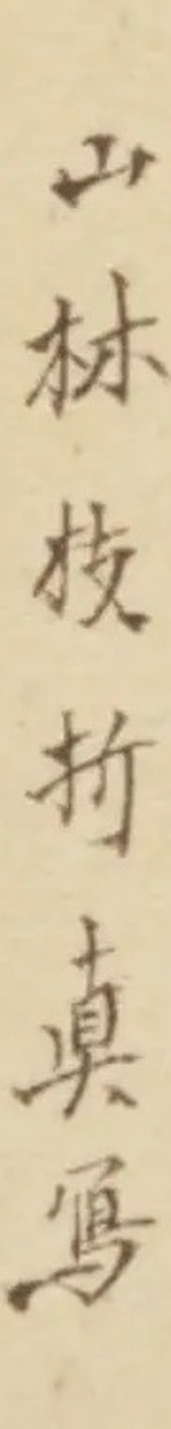山林枝折真写

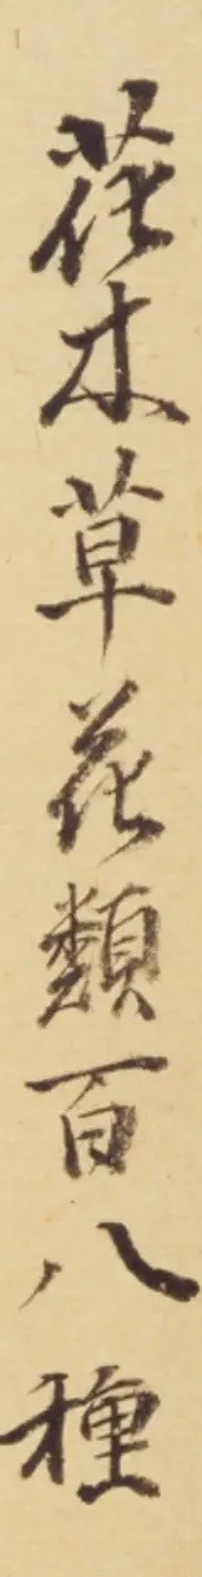花木草花百八種
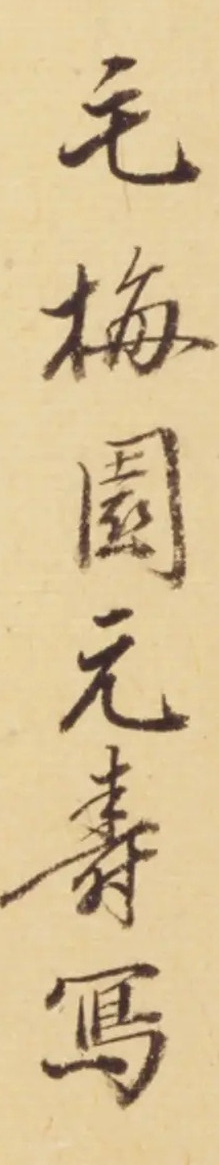毛梅園元寿写
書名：梅園草木花譜春之部. 1
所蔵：国立国会図書館 National Diet Library, JAPAN
